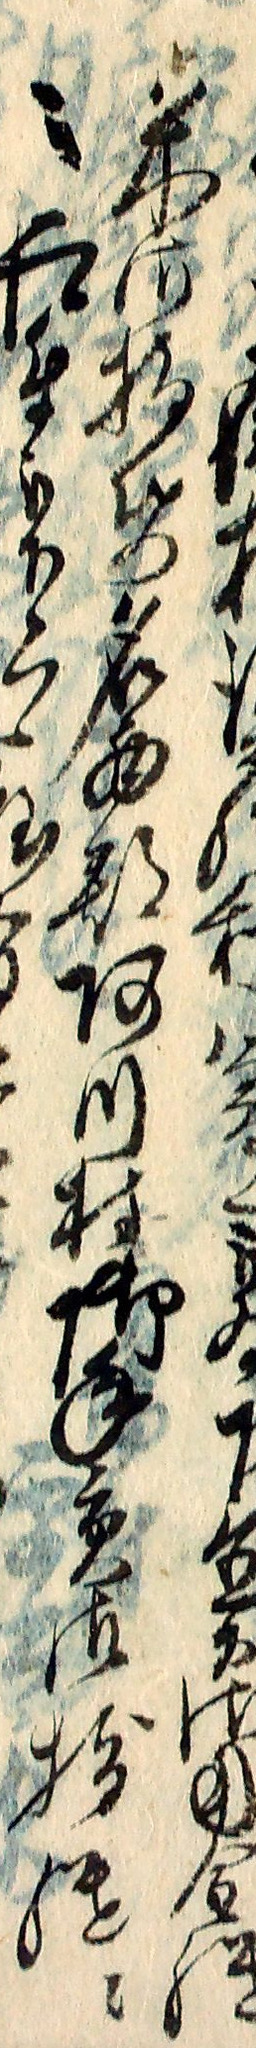米御指紙名西郡阿川村御年貢御指継に
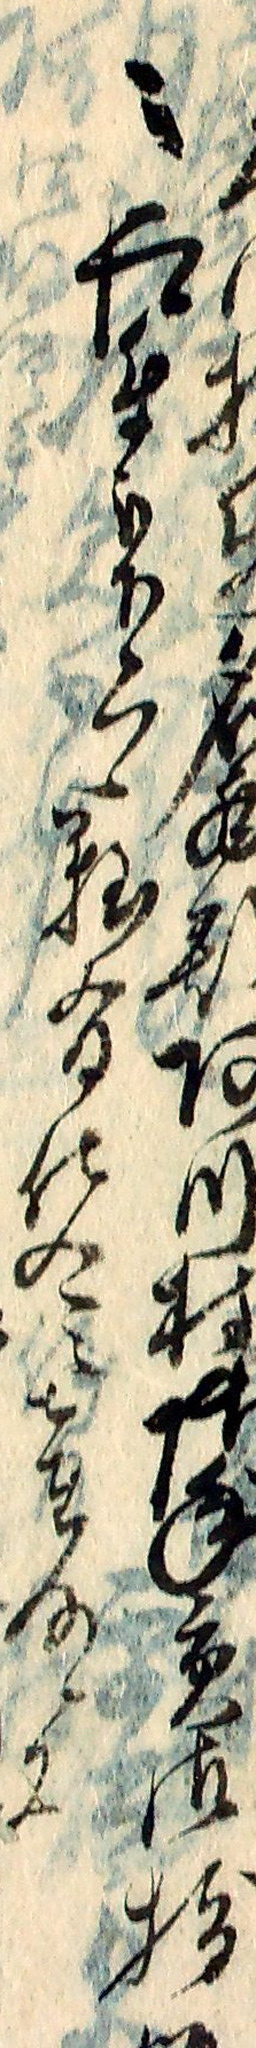被仰付被下候はゝ難有仕合に可奉存候以上
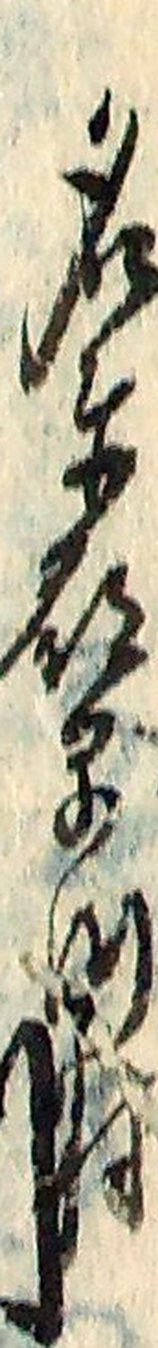名東郡早淵村
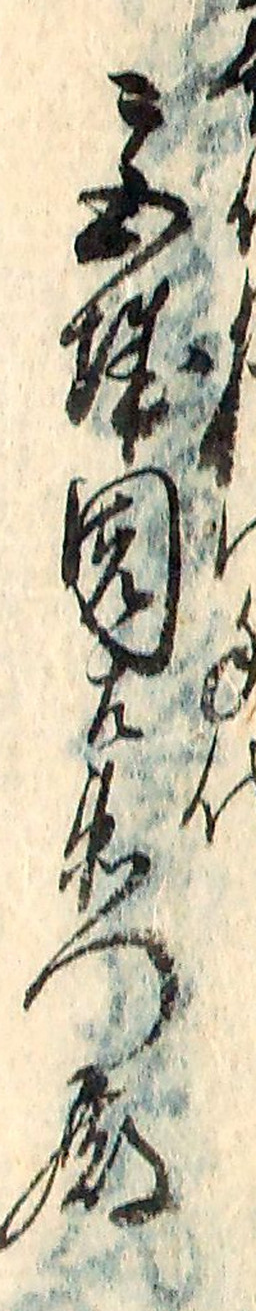宮城周左衛門殿

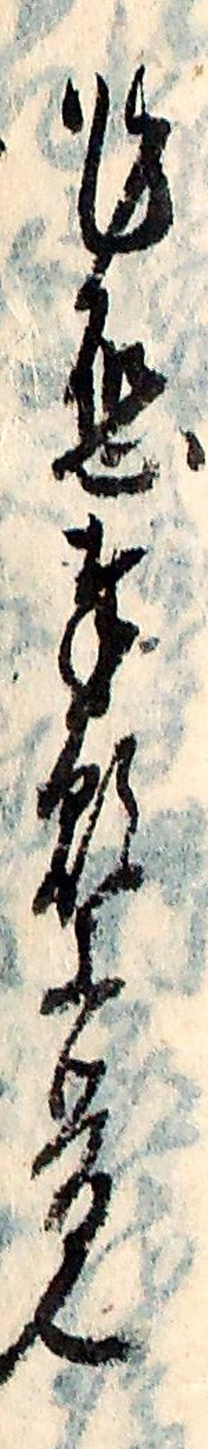乍恐奉願上覚
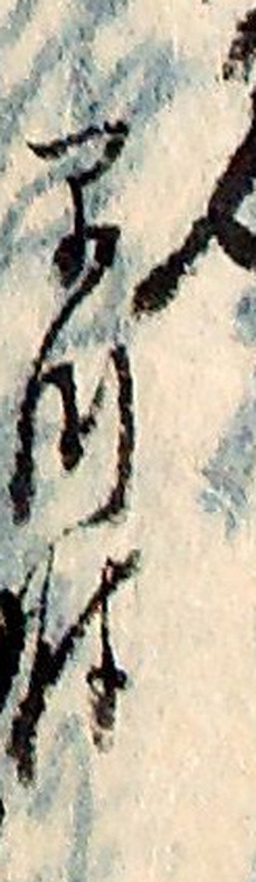早淵村
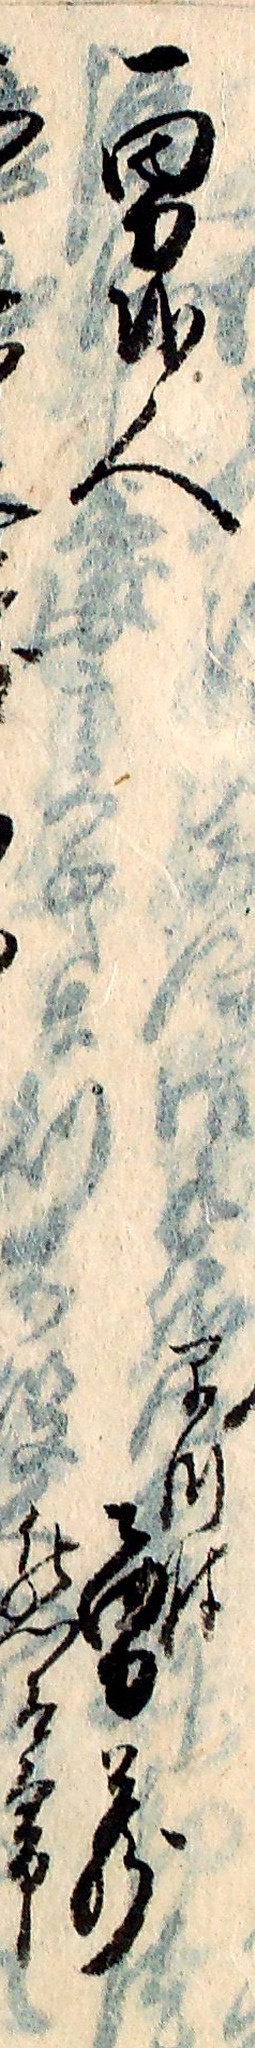一男弐人勇蔵
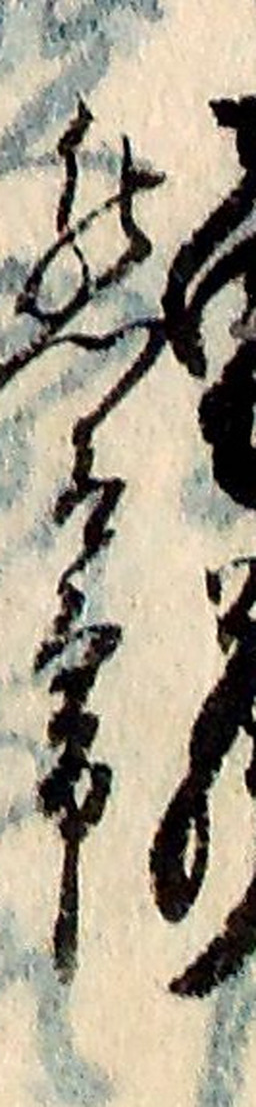熊太郎
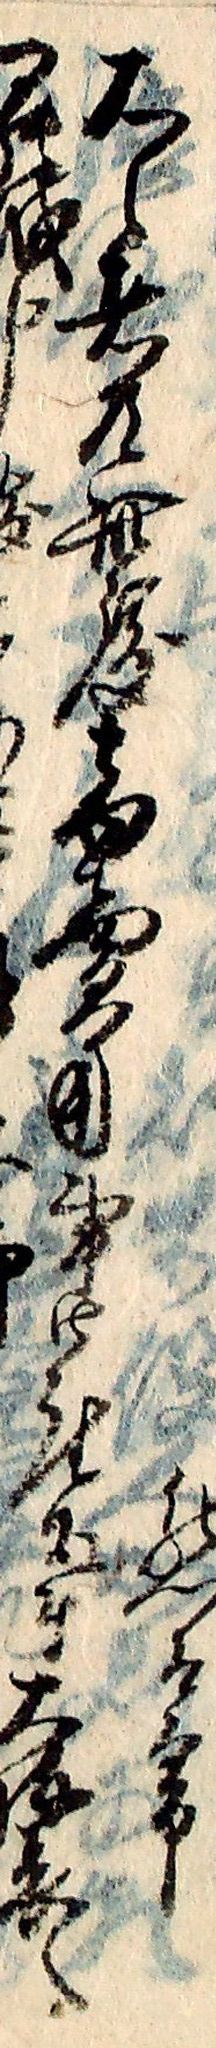右之者共此度商売用事御座候に付大坂表へ
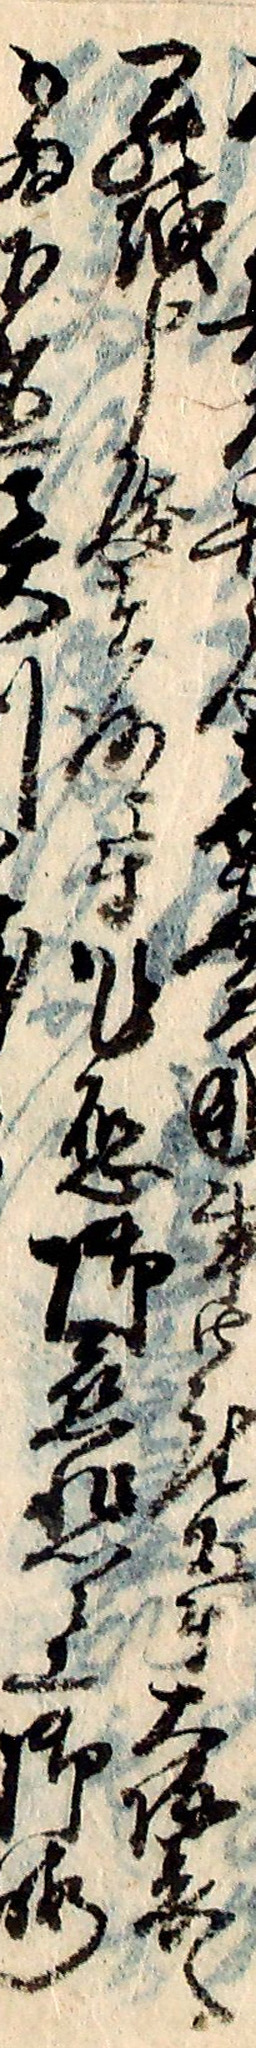罷越申度奉存候に付乍恐御慈悲之上御暇
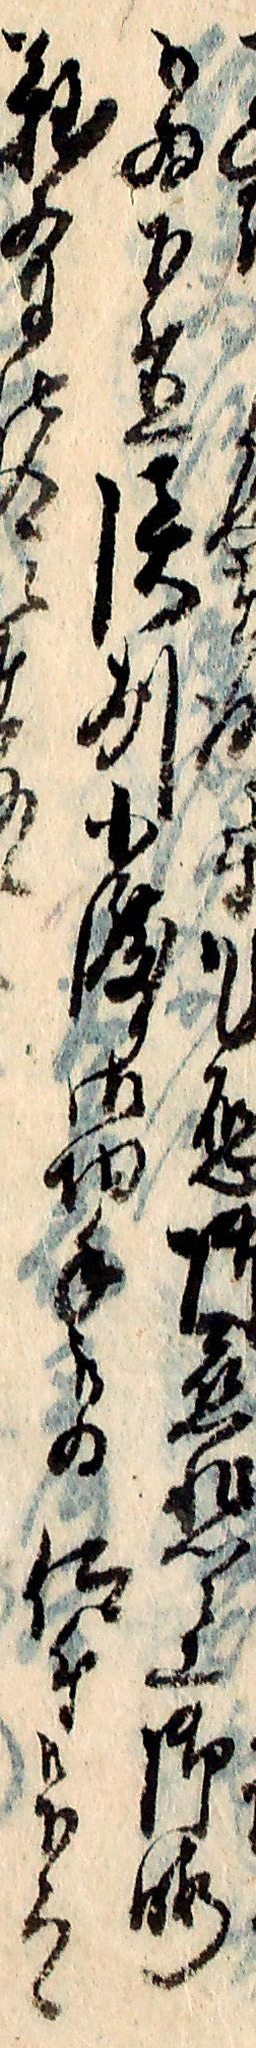被為下置淡州小渡り御切手被為仰付被下候はゝ
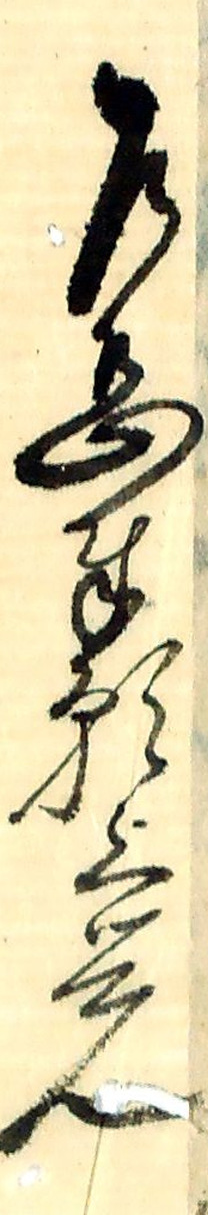乍恐奉願上覚
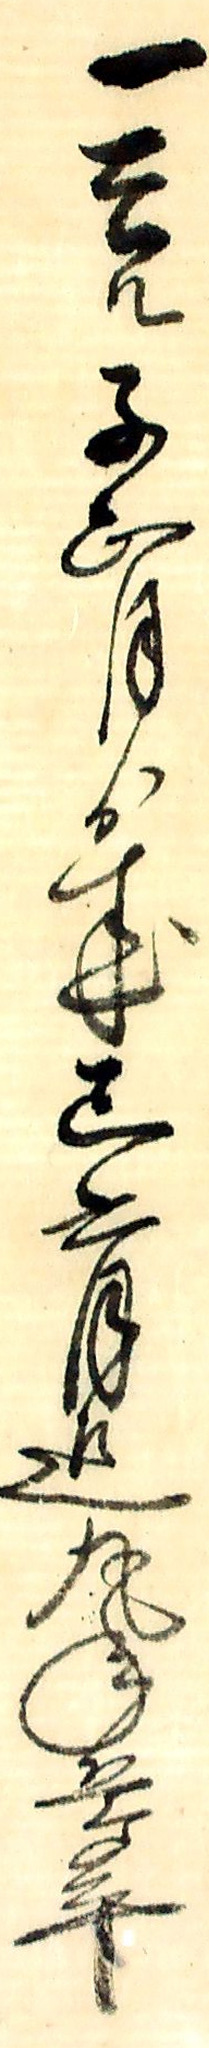一去る子正月ゟ来巳六月迄丸年五ヶ年
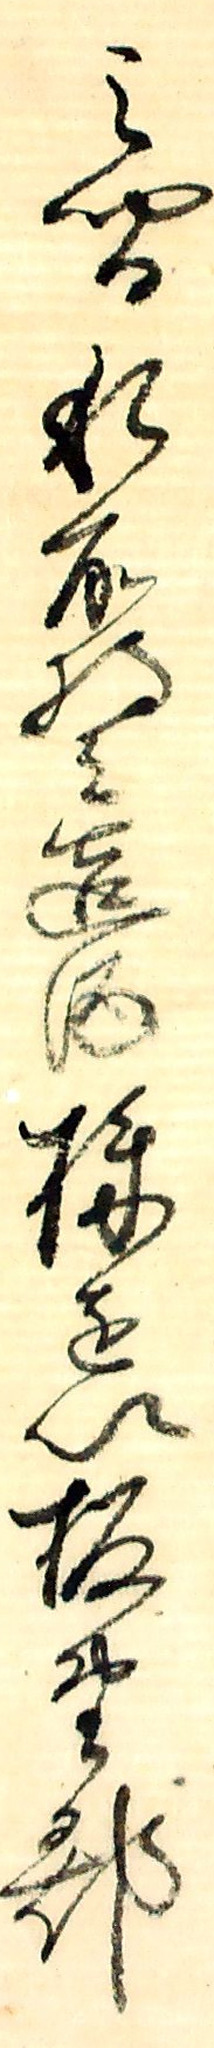之間私所持之造酒株を以板野郡
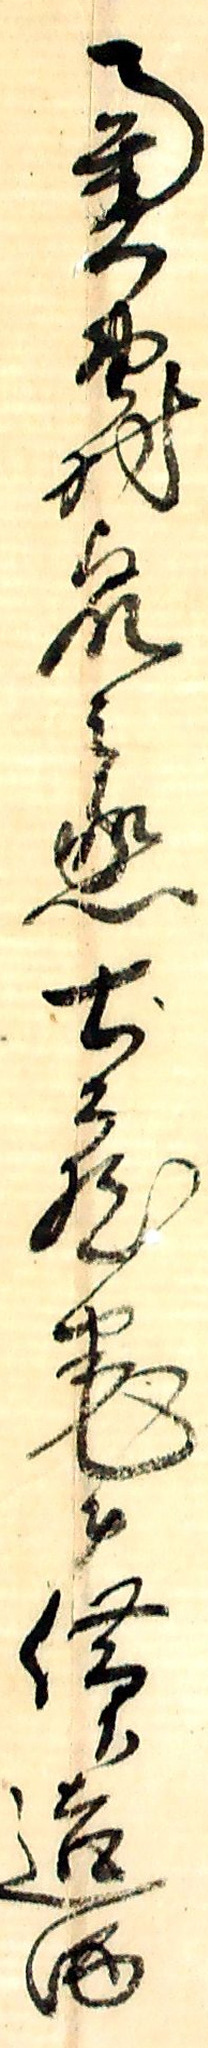奥野村虎之丞土蔵宅を借り造酒
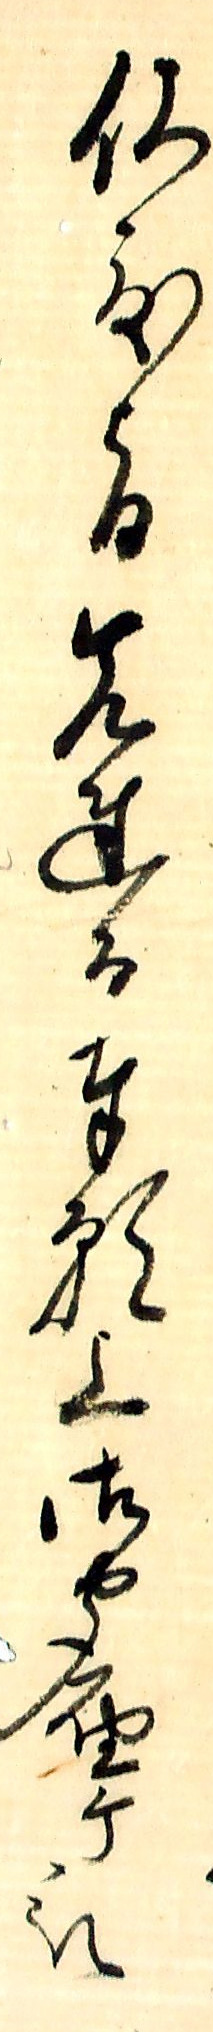仕度旨先達て奉願上御聞届け被
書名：諸御願書控(後藤氏壱番）
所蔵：鳴門教育大学 Naruto University of Education
